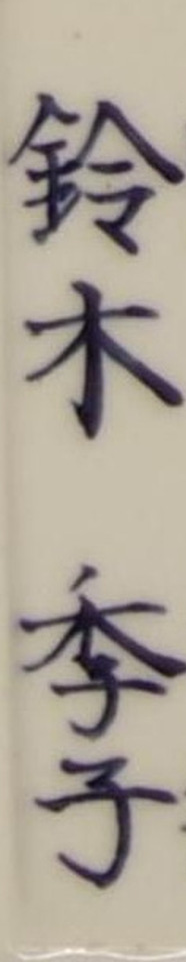鈴木季子

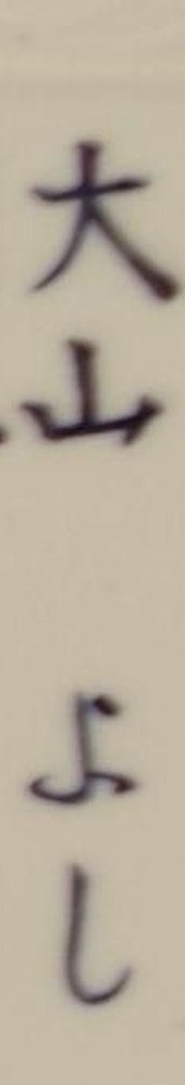大山よし
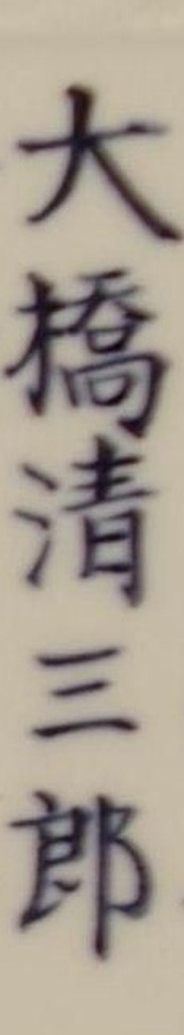大橋清三郎
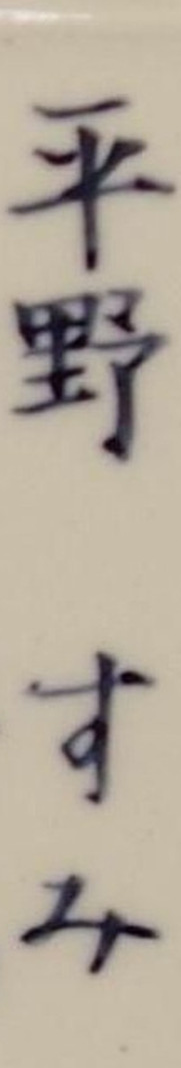平野すみ
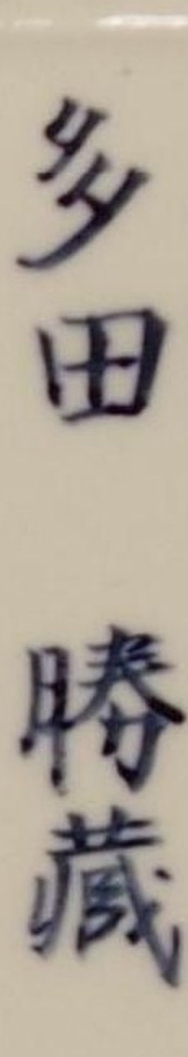多田勝蔵
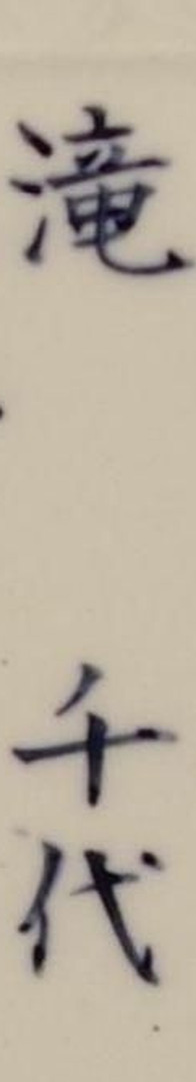滝千代
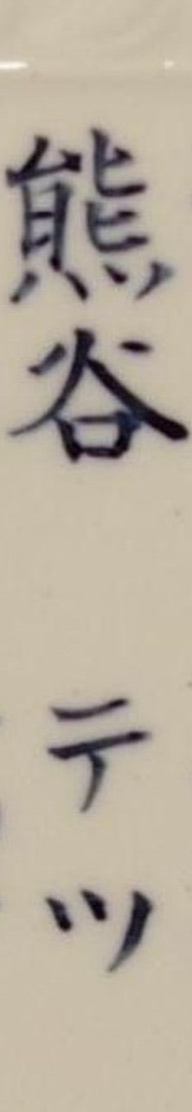熊谷テツ
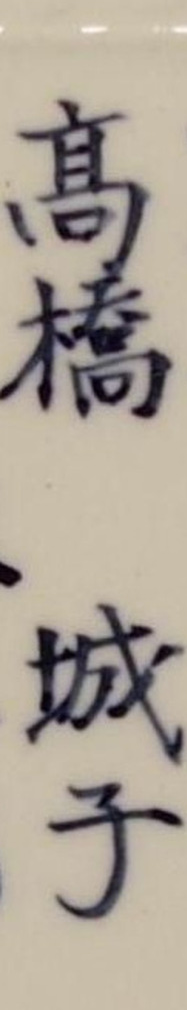高橋城子
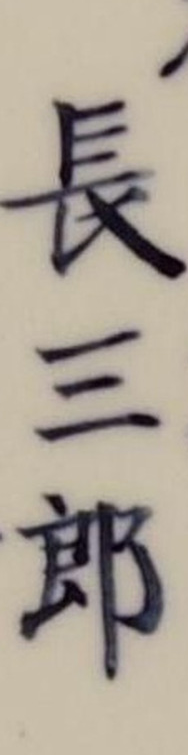長三郎
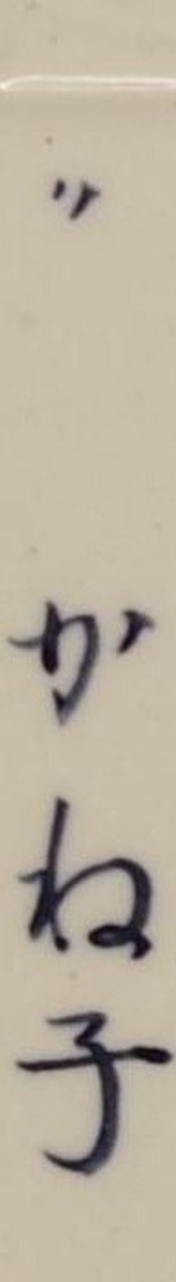かね子
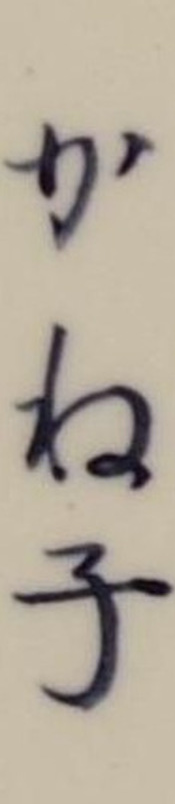かね子
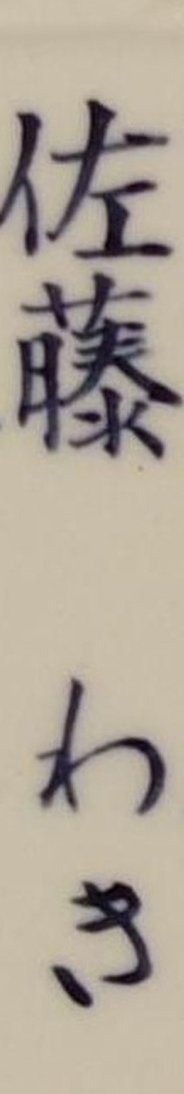佐藤わき
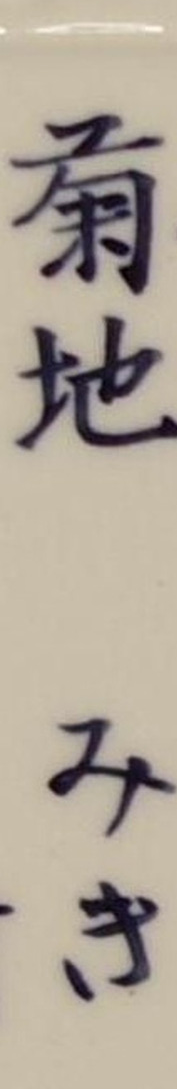菊地みき
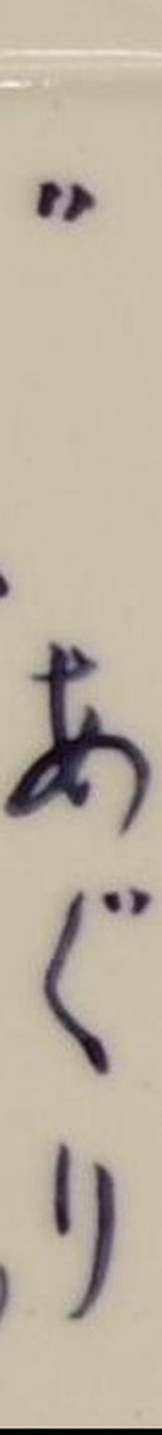あぐり
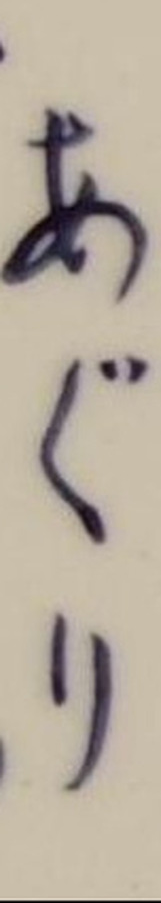あぐり
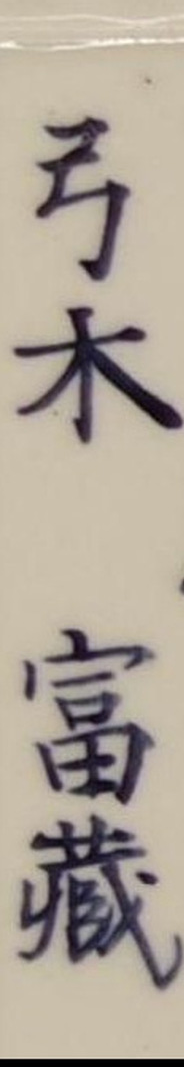弓木富蔵
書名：M~S
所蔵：高野山金剛峯寺
